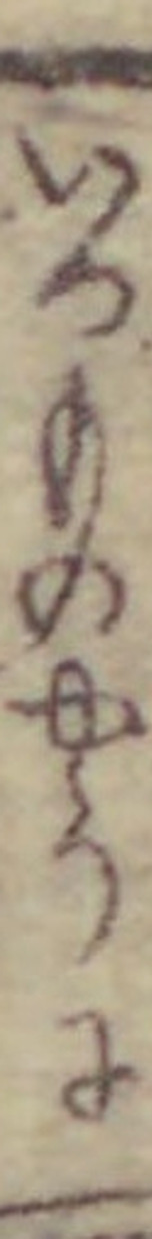いつものやうに
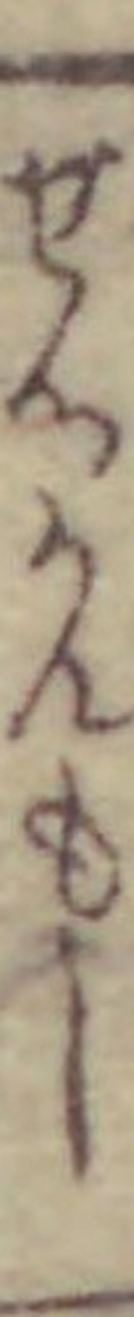せつかんもし
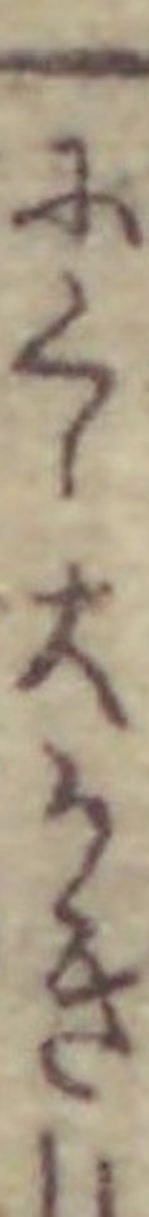にくゝ大かき
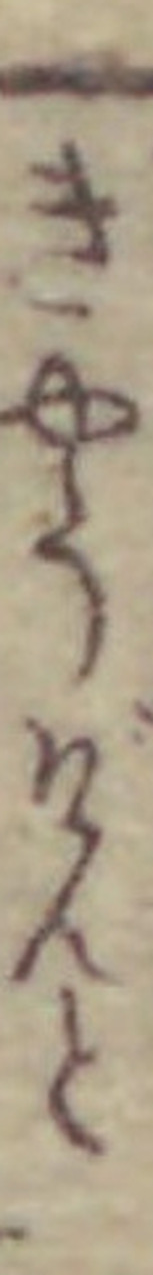きやうげんと
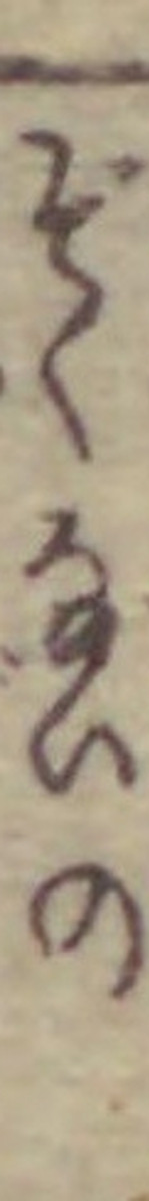ぞくないの
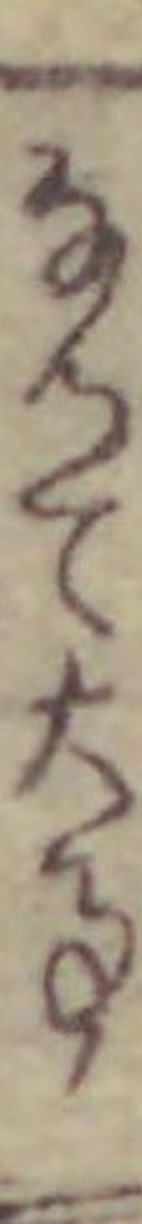なつて大事
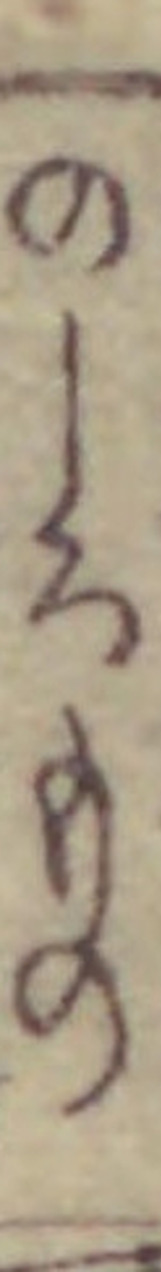のしろもの
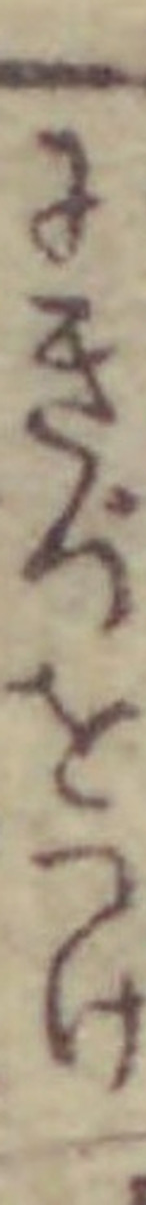にきづをつけ
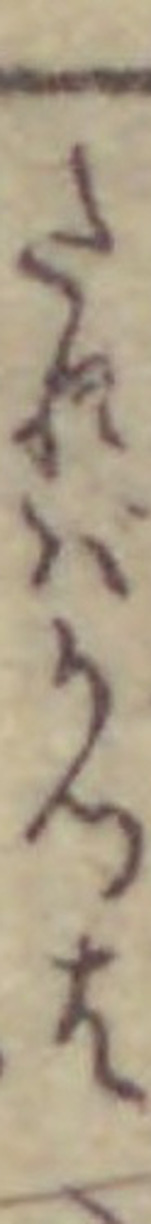たればかつは
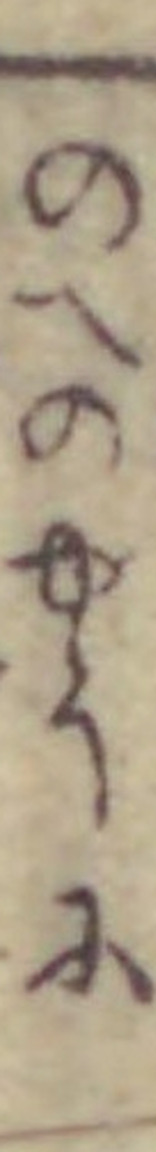のへのやうに
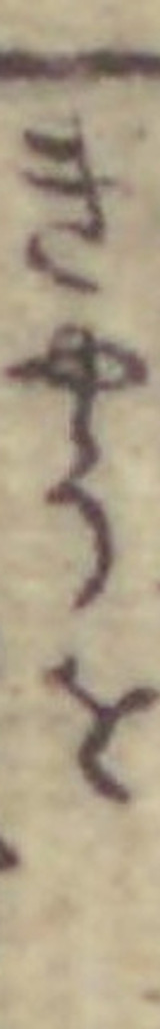きやうを
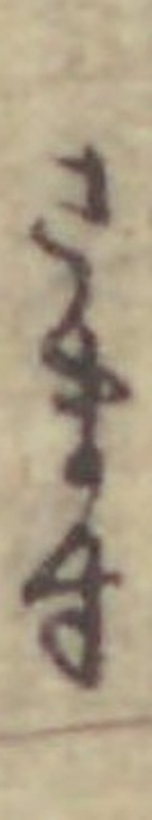さます
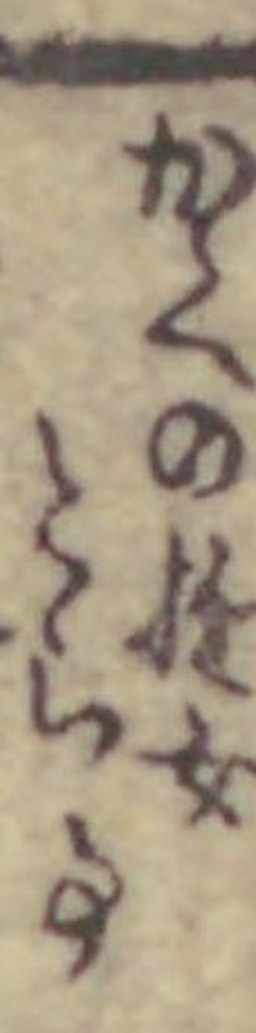とら事
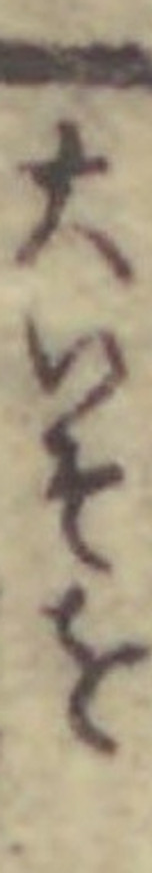大いそを
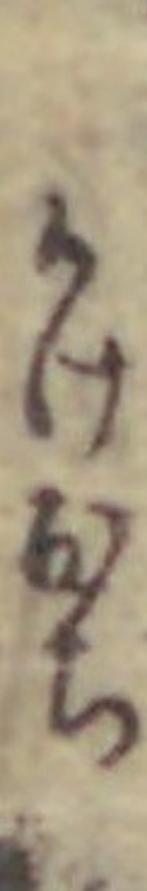かけおち
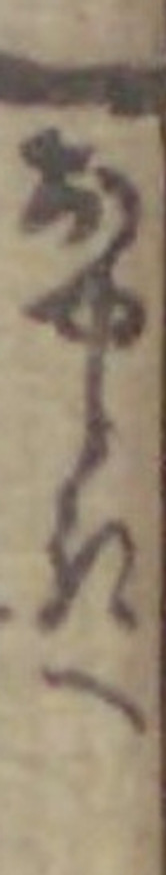おやしきへ
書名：間似合嘘言曽我 3巻
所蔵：国立国会図書館 National Diet Library, JAPAN
